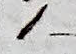1
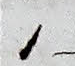1
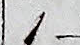1
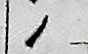1
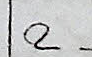2
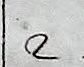2
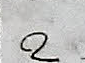2
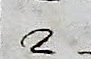2
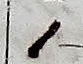1
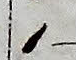1
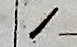1
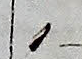1
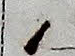1
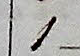1
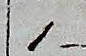1
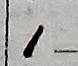1
